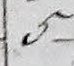5
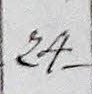24
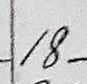18
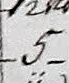5
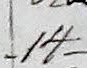14
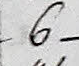6
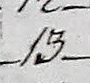13
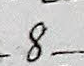8
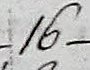16
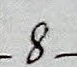8
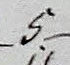5
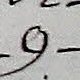9
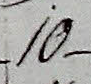10
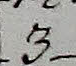3
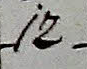12
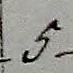5
